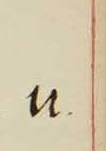11.
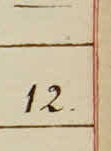12.
